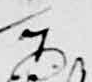7
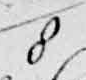8
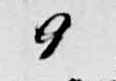9
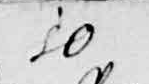10
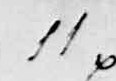11
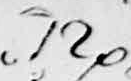12
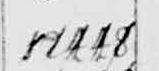12448
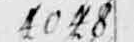4048
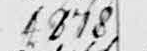4878
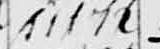11172
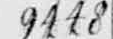9448
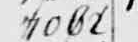7062
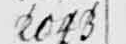2043
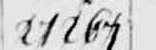27267
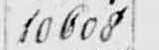10608
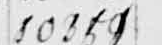10359
